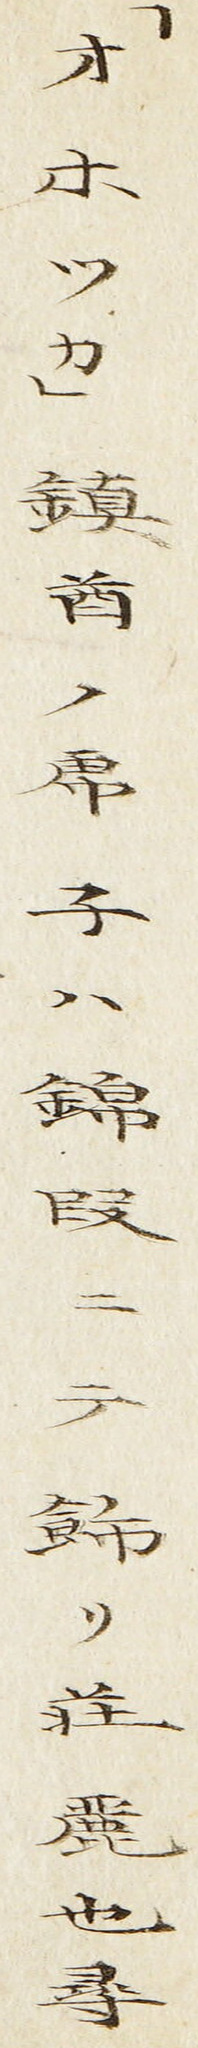〇「オホツカ」鎮酋ノ子ハ錦叚ニテ飾リ荘麗也尋
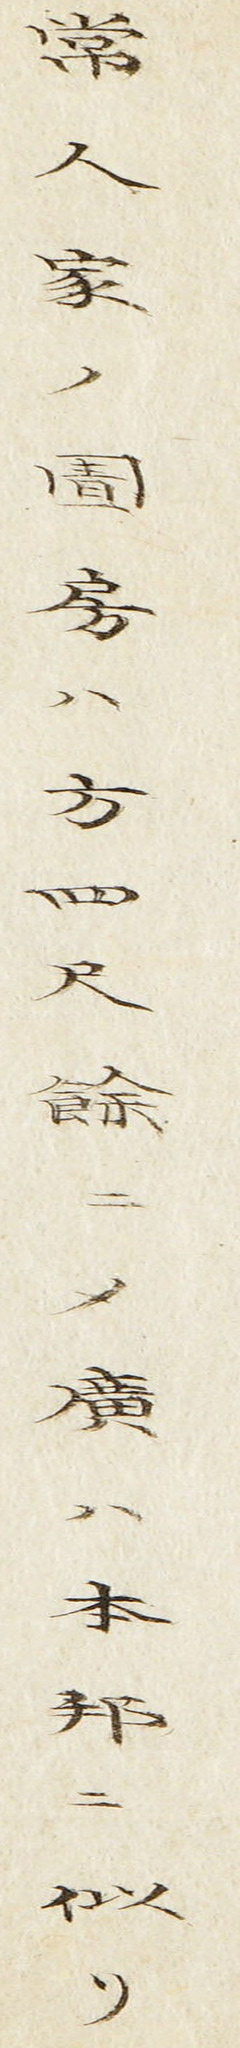常人家ノ圊房ハ方四尺余ニシテ広ハ本邦ニ似リ
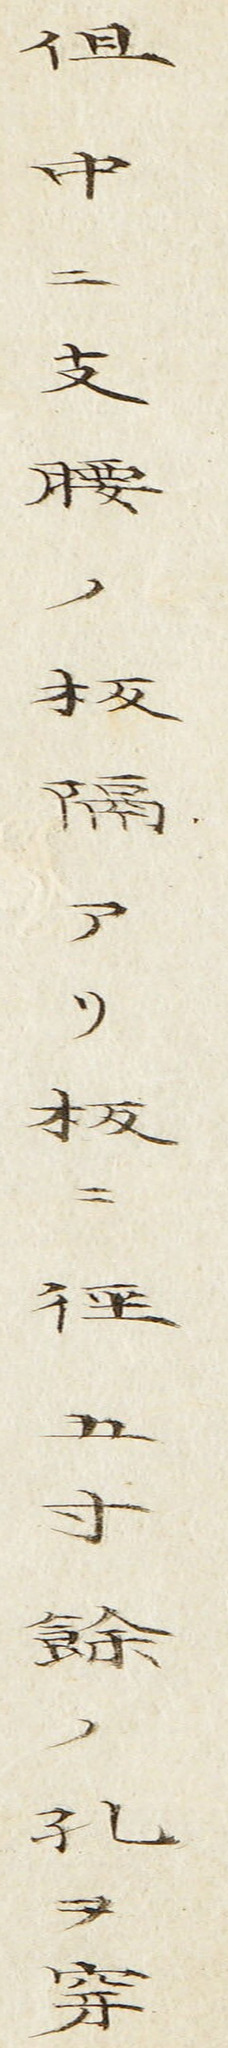但中ニ支腰ノ板隔アリ板ニ五寸余ノ孔ヲ穿
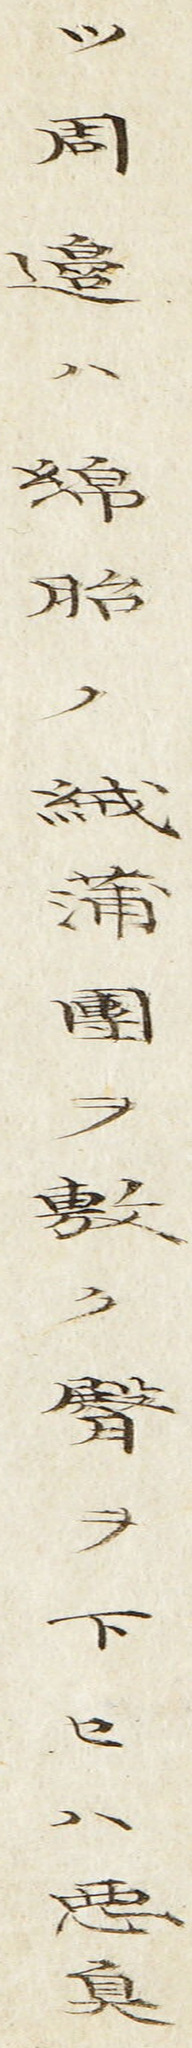ツ周辺ハ綿胎ノ絨蒲団ヲ敷ク臀ヲ下セハ悪臭
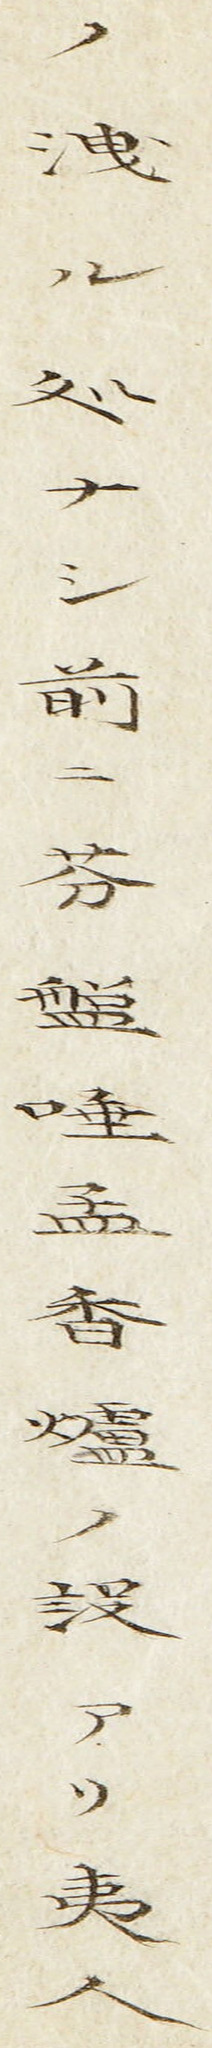ノ洩ル処ナシ前ニ芬盤唾孟香炉ノ設アリ夷人
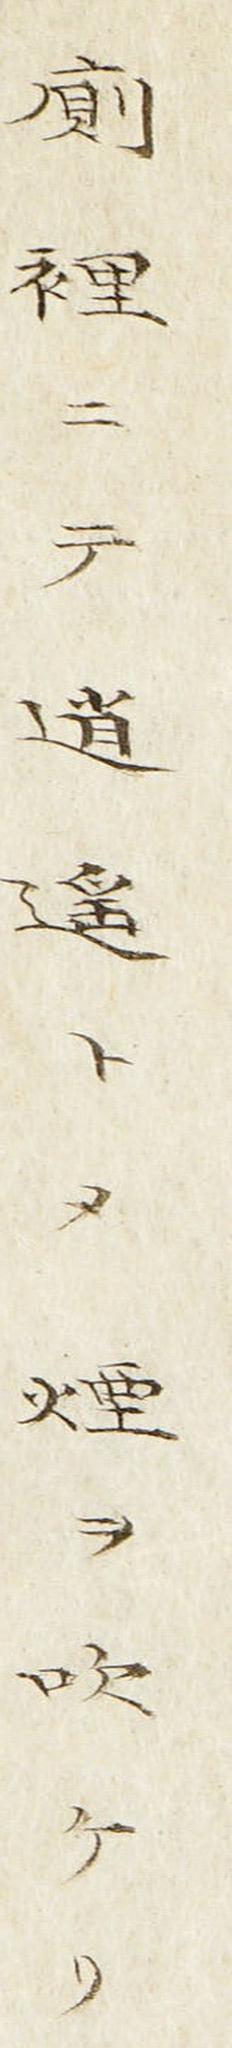厠裡ニテ逍遥トシテ煙ヲ吹ケリ

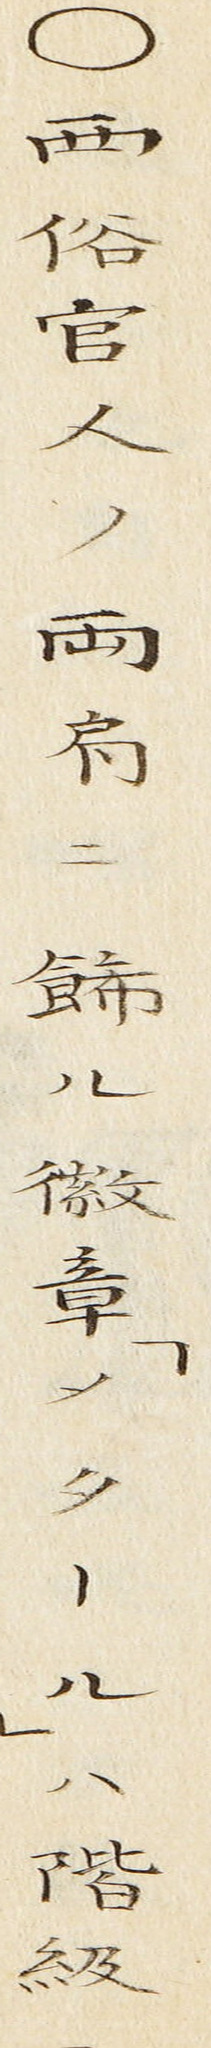〇西俗官人ノ両肩ニ飾ル徽章「メタール」ハ階級ニ
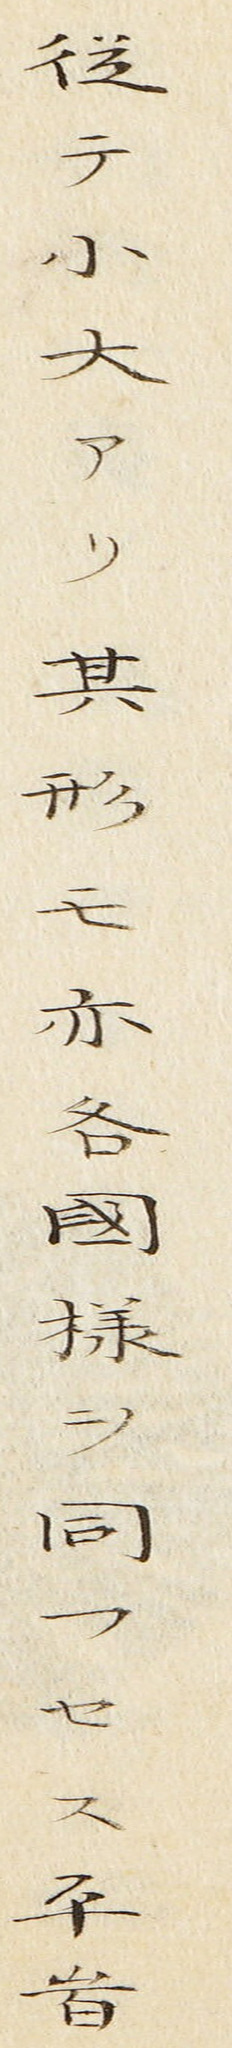従テ小大アリ其形モ亦各国様ヲ同フセス平旹
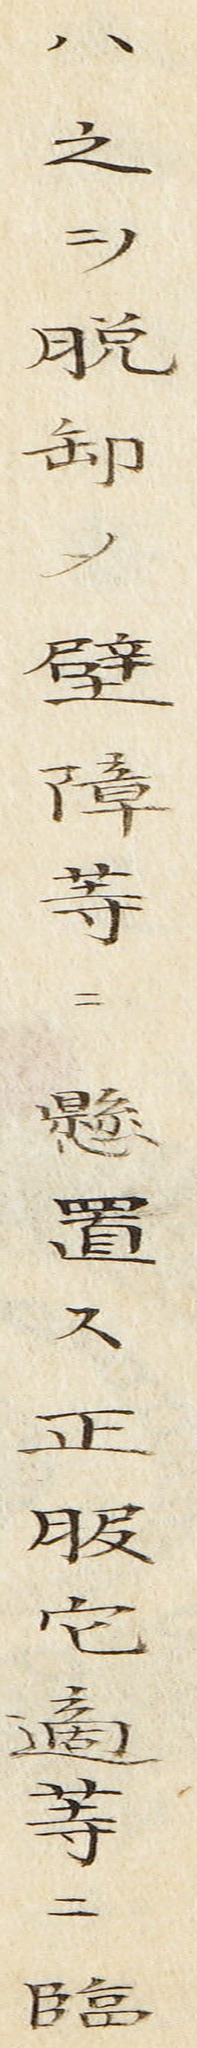ハ之ヲ脱却シテ壁障等ニ懸置ス正服它適等ニ臨
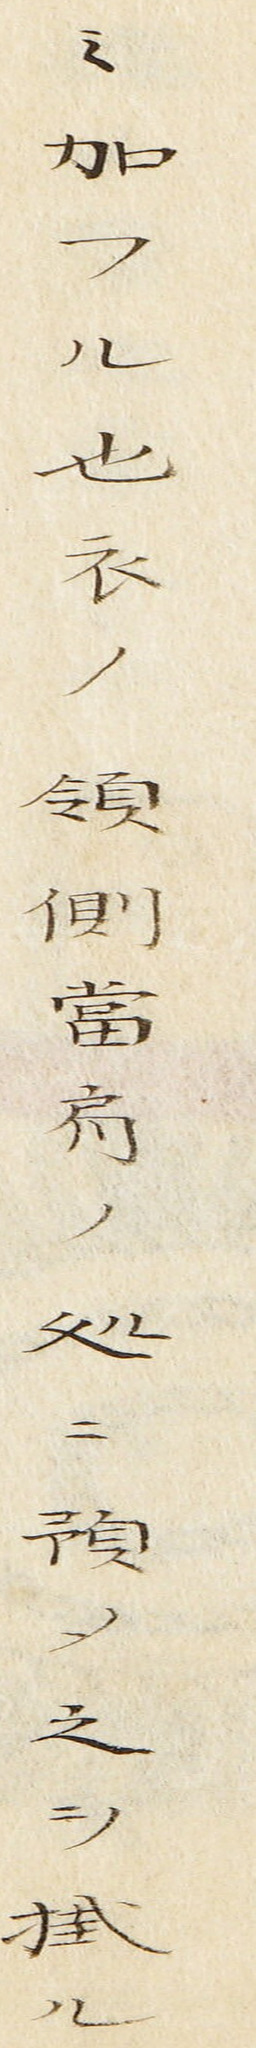ミ加フル也衣ノ領側當肩ノ処ニ預シテ之ヲル
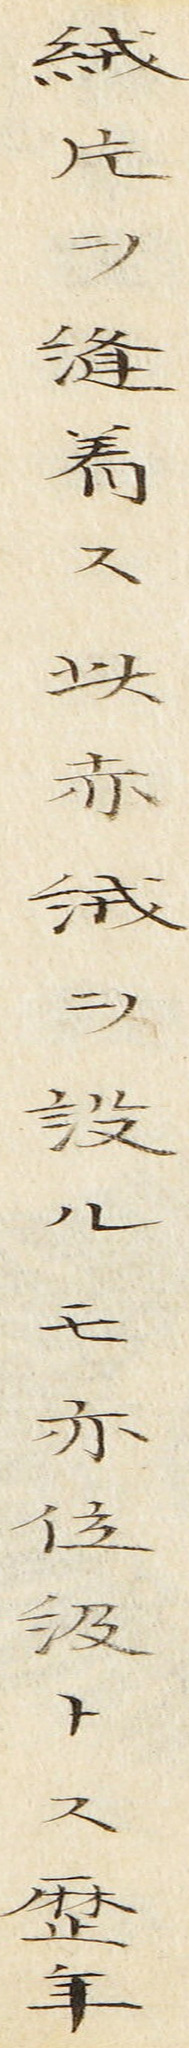絨片ヲ縫着ス此赤絨ヲ設ルモ亦位級トス歴年
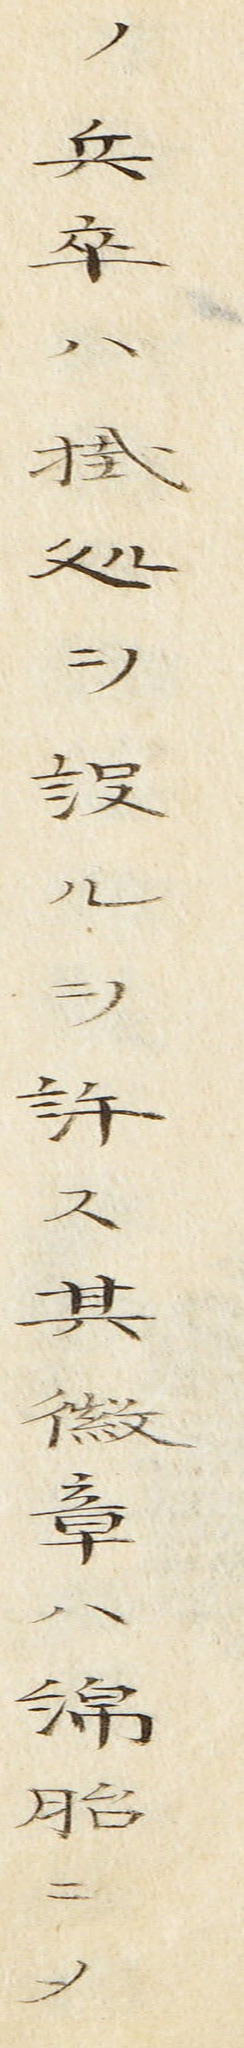ノ兵卒ハ処ヲ設ルヲ許ス其徽章ハ綿胎ニシテ
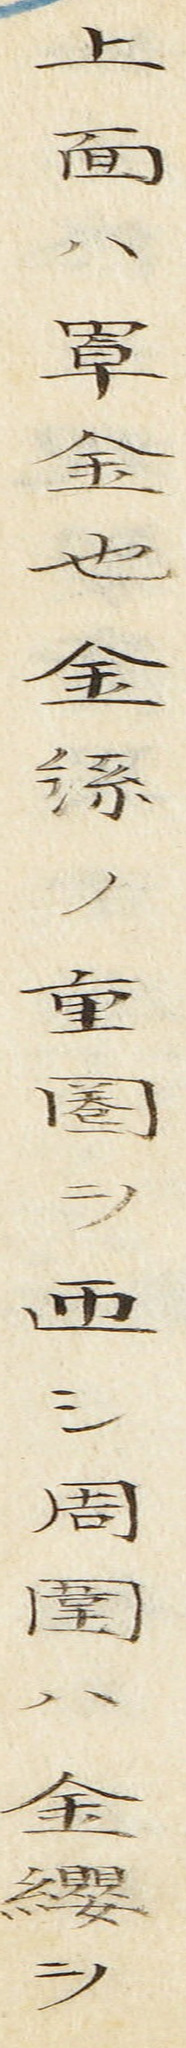上面ハ金也金ノ重圏ヲ匝シ周囲ハ金纓ヲ
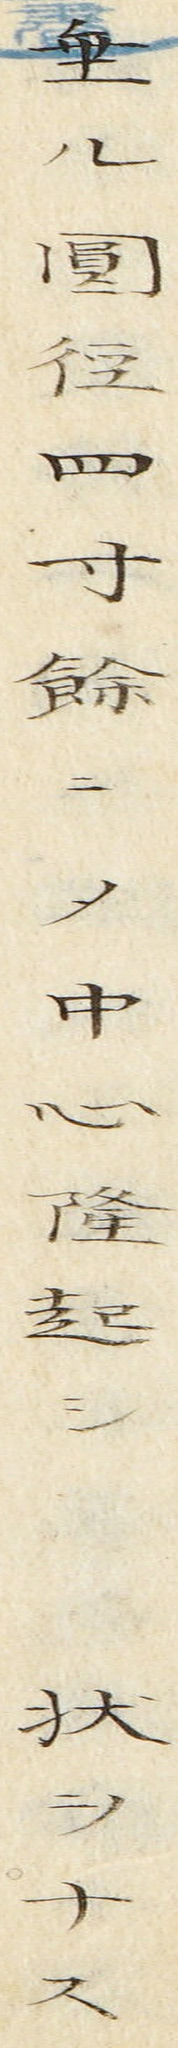垂ル鴛圓径四寸餘ニシテ中心隆起シ状ヲナス
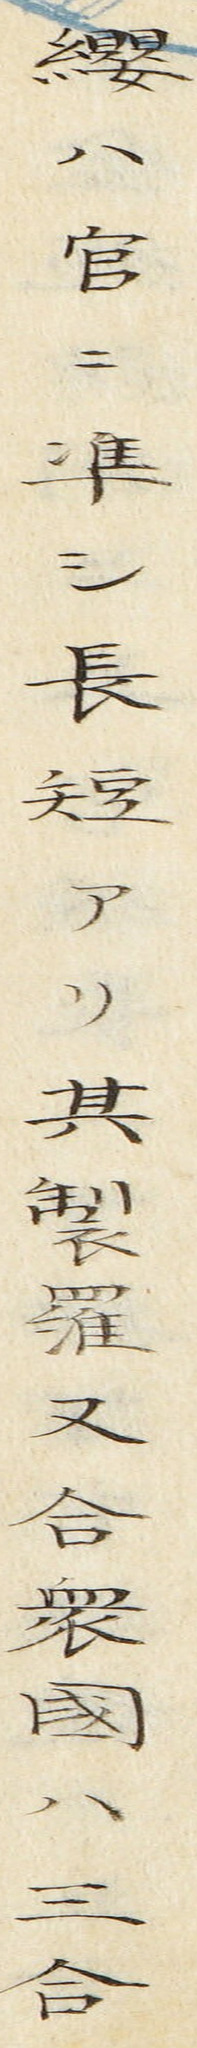纓ハ官ニ準シ長短アリ其製羅又合衆國ハ三合

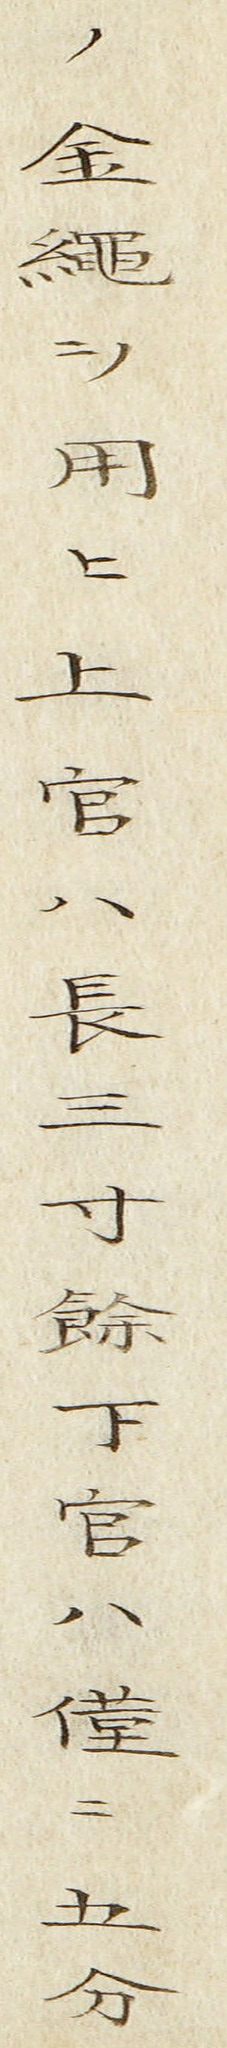ノ金縄ヲ用ヒ上官ハ長三寸余下官ハ僅ニ五分
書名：蕃談
